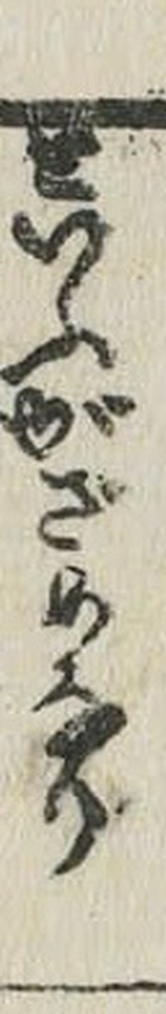といふがざめなり
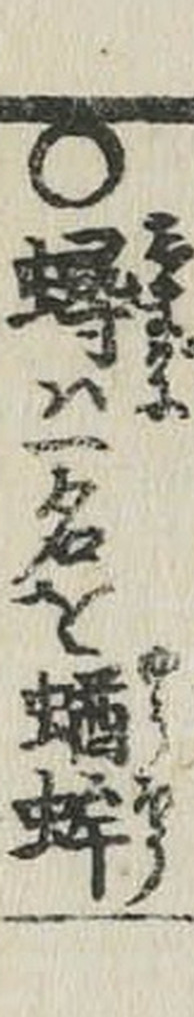○𧔒は一名を黄甲
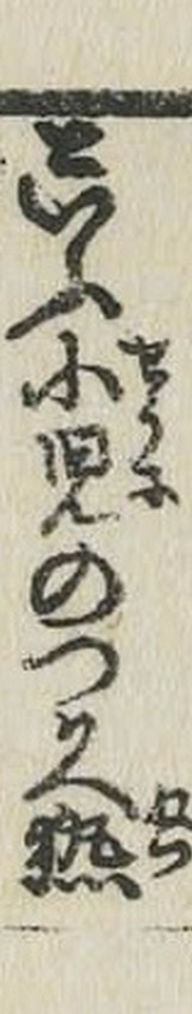といふ小児のつかへ熱
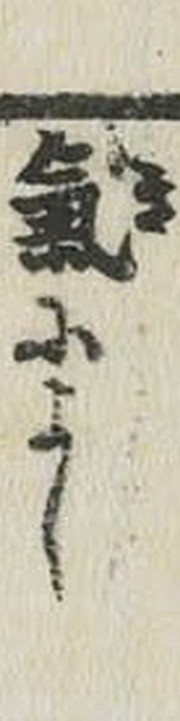気によし
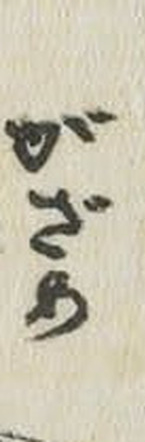がざめ
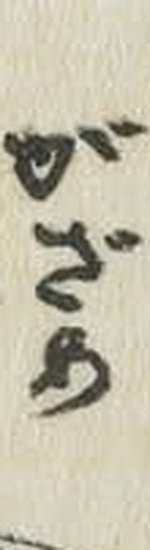がざめ
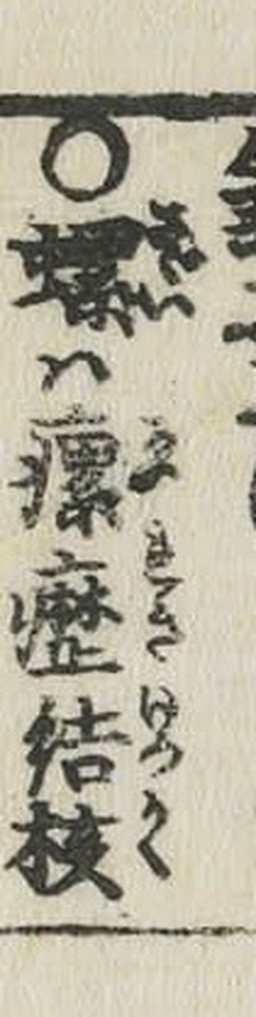○螺は瘰癧結核
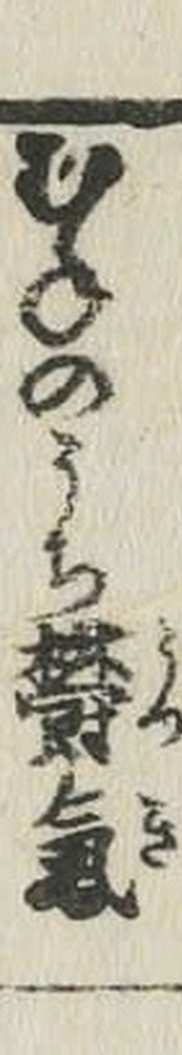むねのうち鬱気
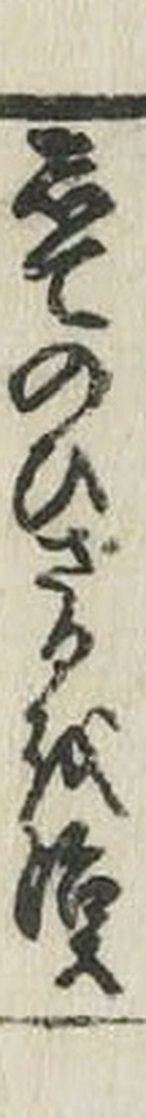してのひざるを治ス
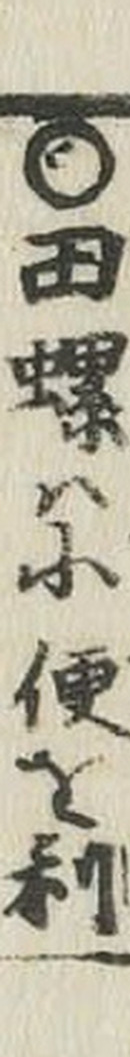○田螺は小便を利
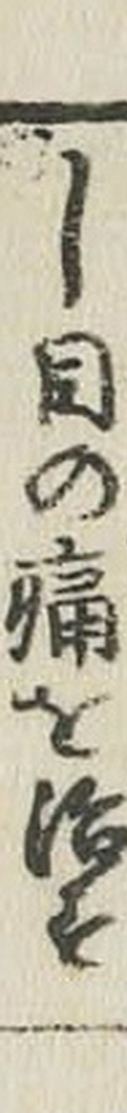し目の痛を治す
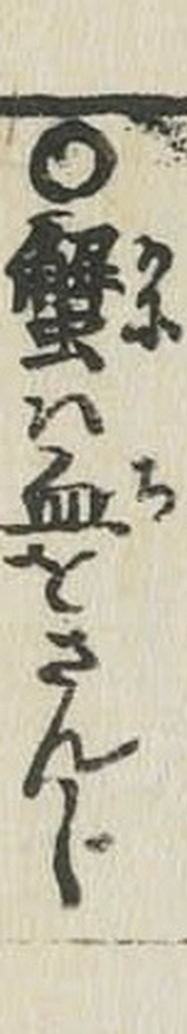○蟹は血をさんじ
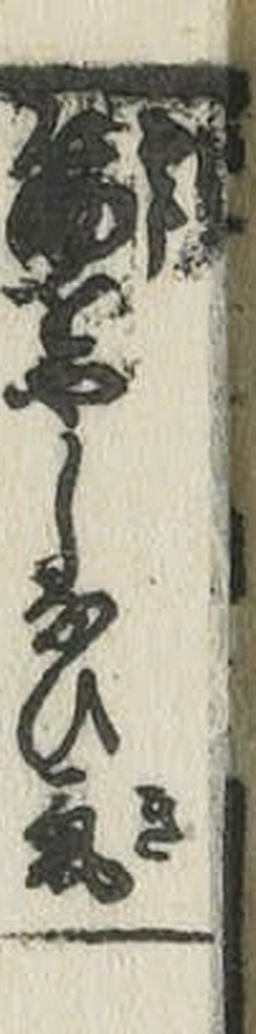筋をやしなひ気
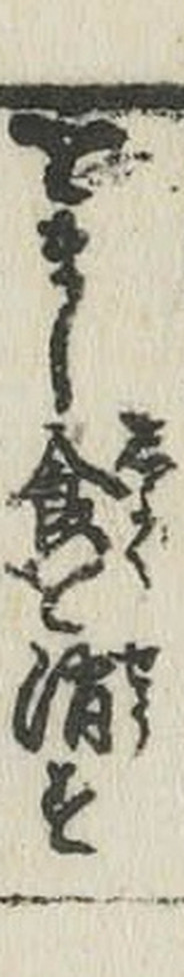をまし食を消す
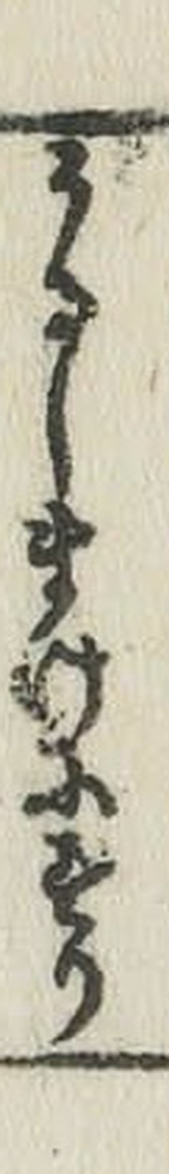うるしまけにすり
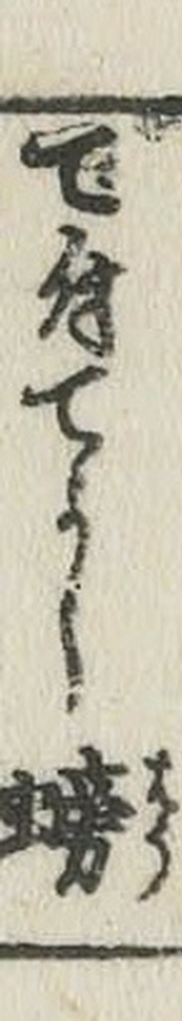て付てよし螃
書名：増補頭書訓蒙図彙大成 10巻 7:巻之14-16
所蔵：東京学芸大学教育コンテンツアーカイブ
